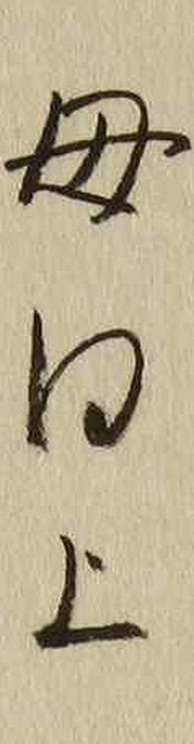母同上
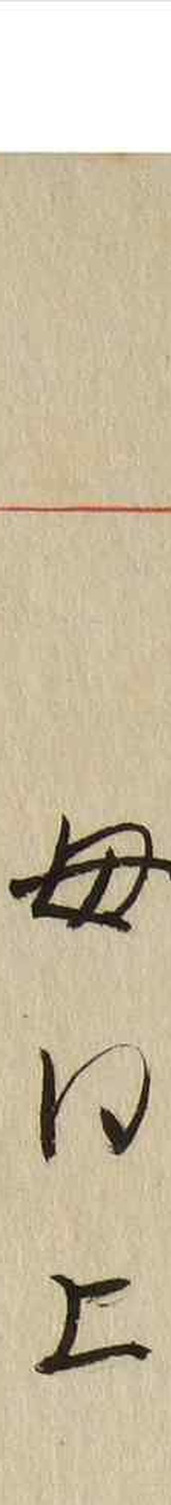母同上
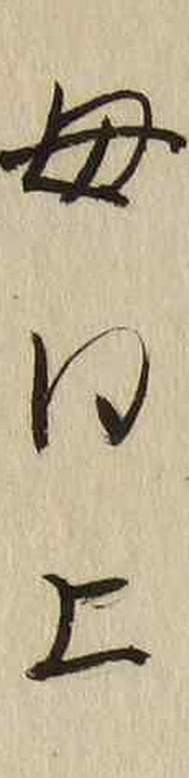母同上

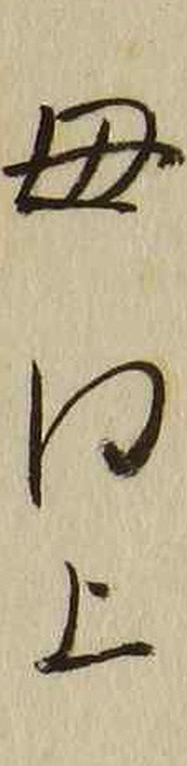母同上
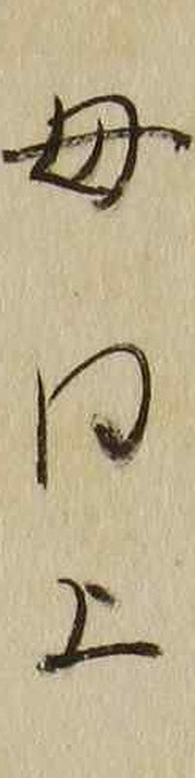母同上
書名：諸士系譜　巻之356　す之部6
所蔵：会津若松市立会津図書館
